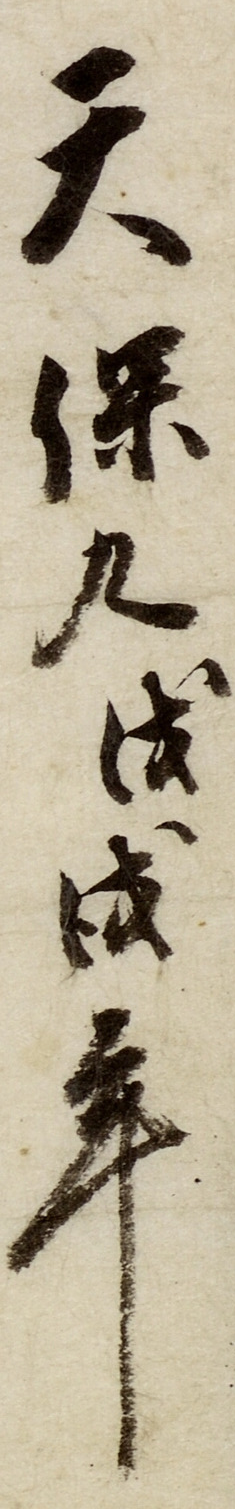天保九戊戌年
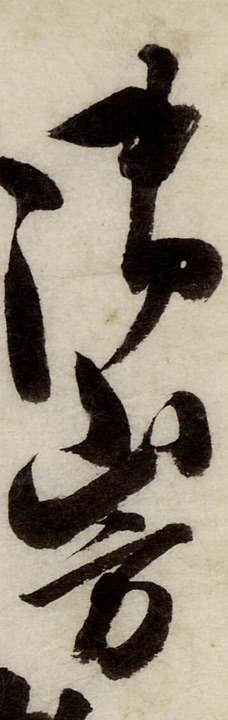御山方
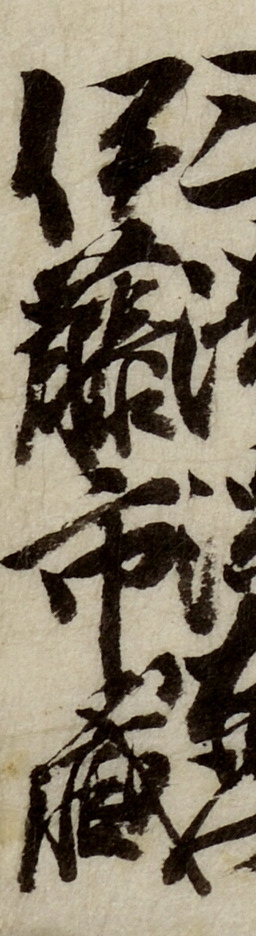伊藤市蔵
